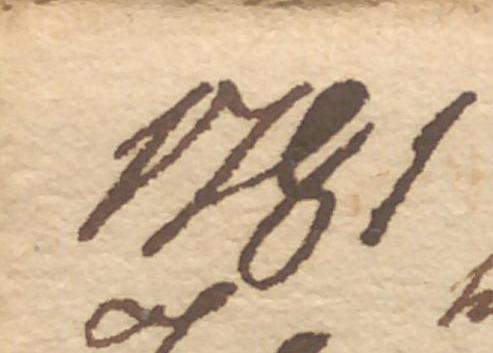1781
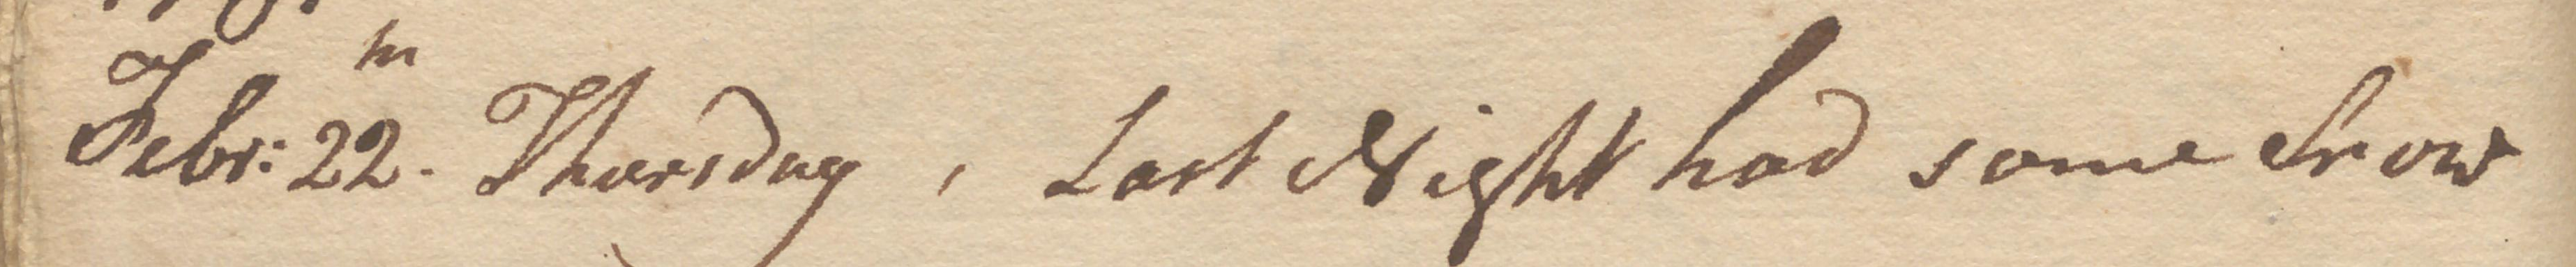Febr: 22^th. Thursday, Last Night had some snow
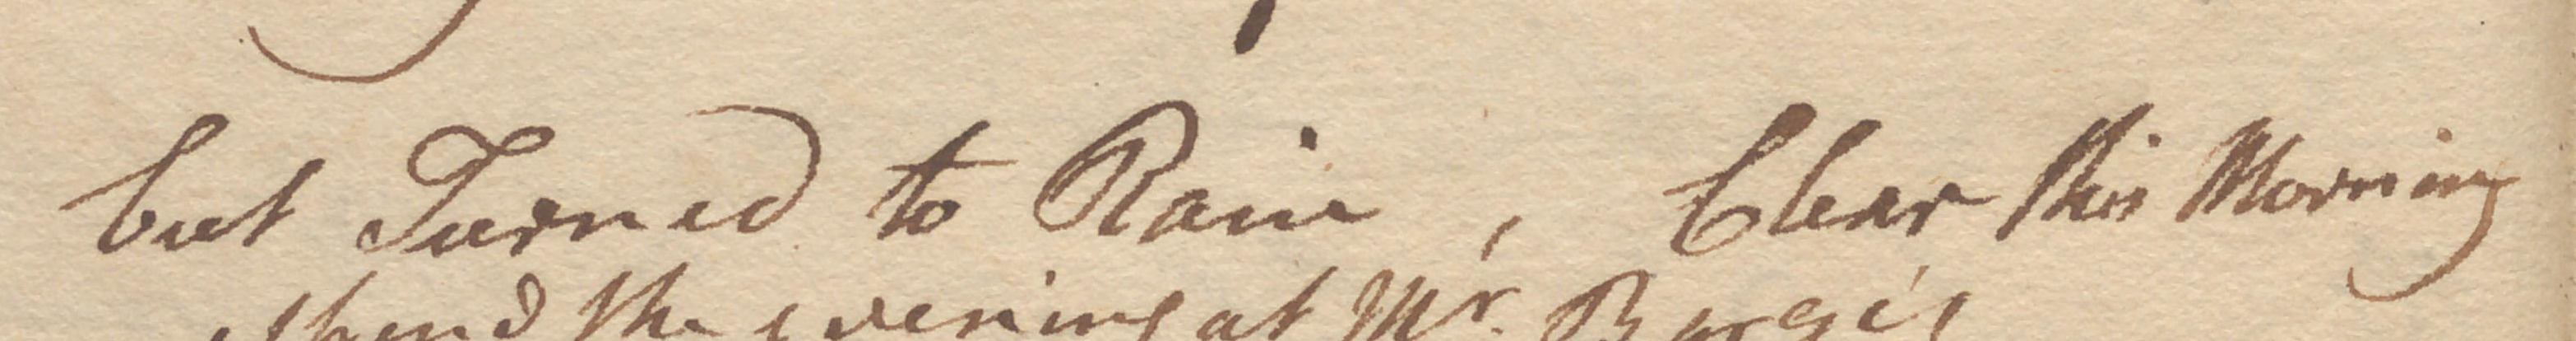but Turned to Rain, Clear this Morning
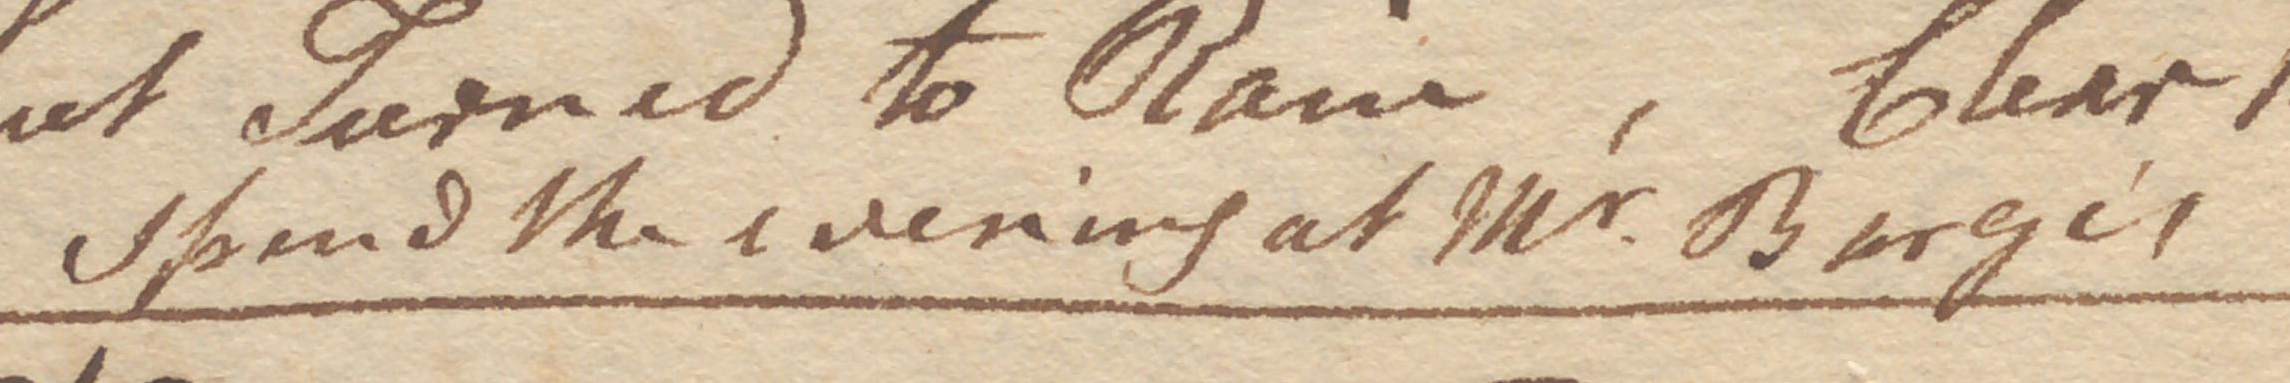spend the evening at M^r. Barges
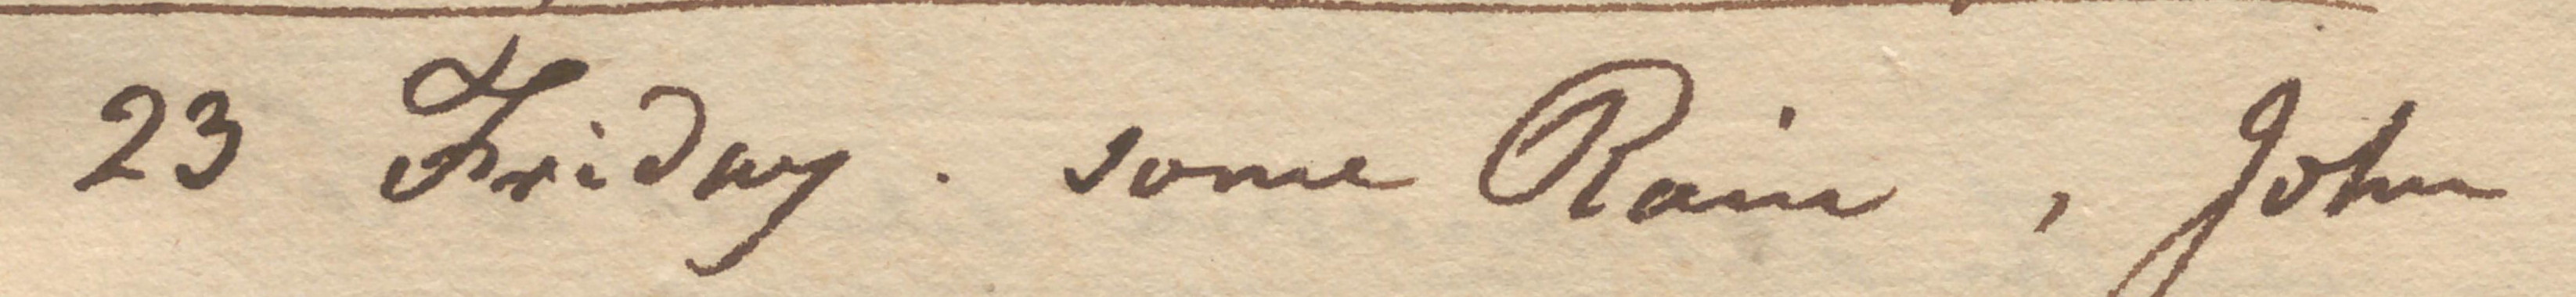23 Friday. some Rain. John
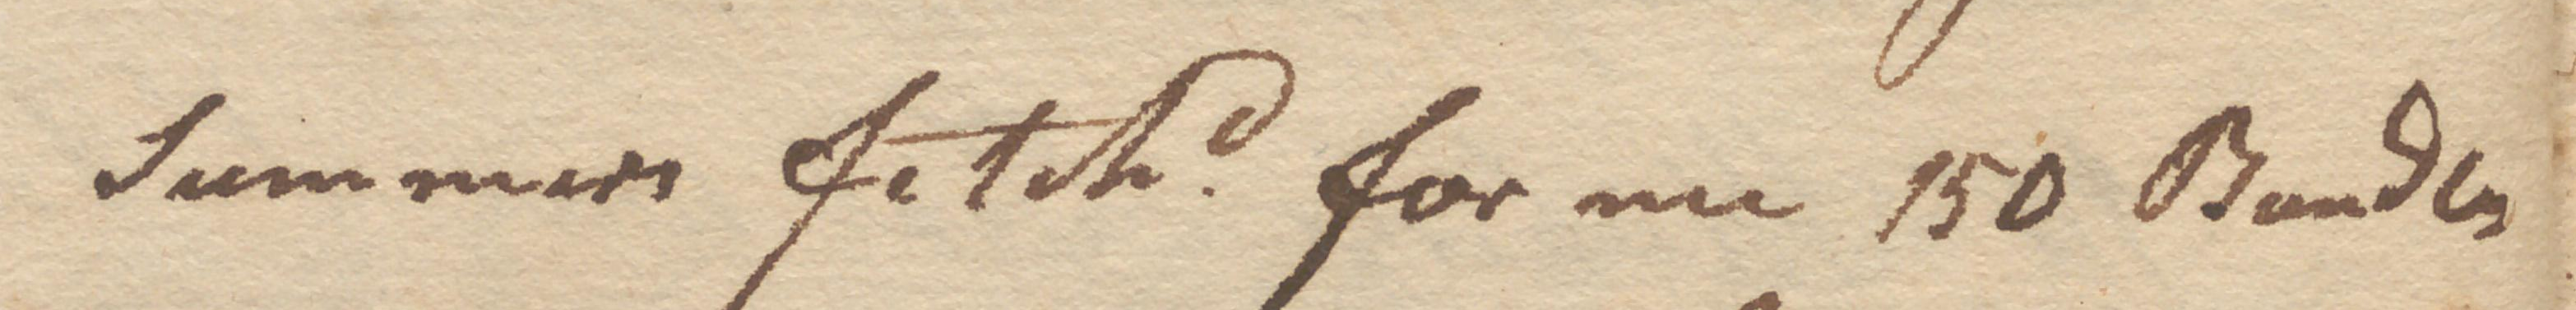Summers fetch^d. for me 150 Bundles
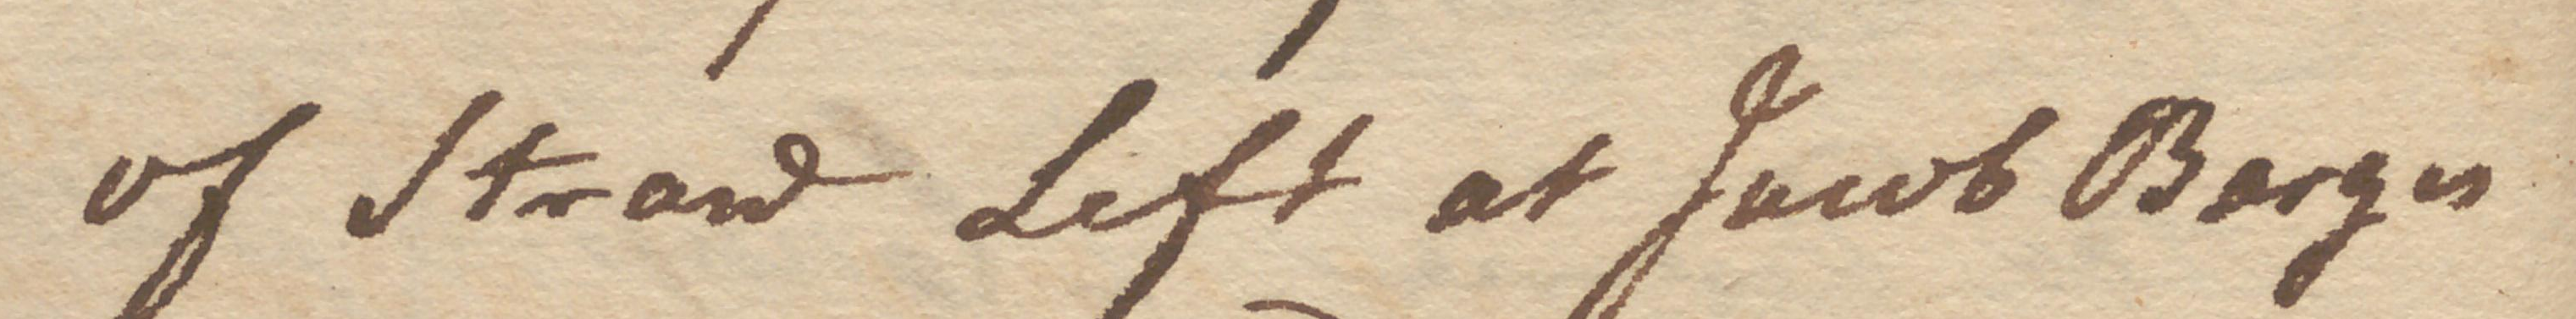of Straw Left at Jacob Barges
